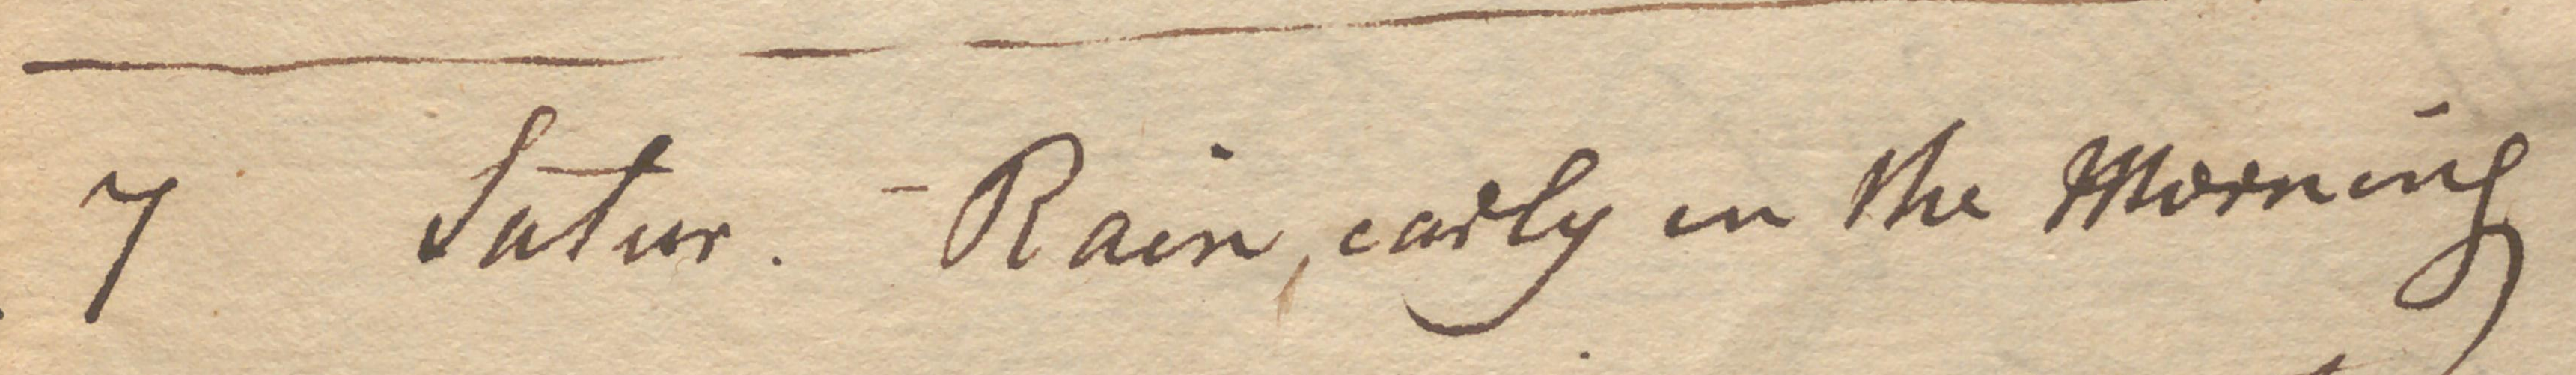7 Satur. Rain early in the Morning
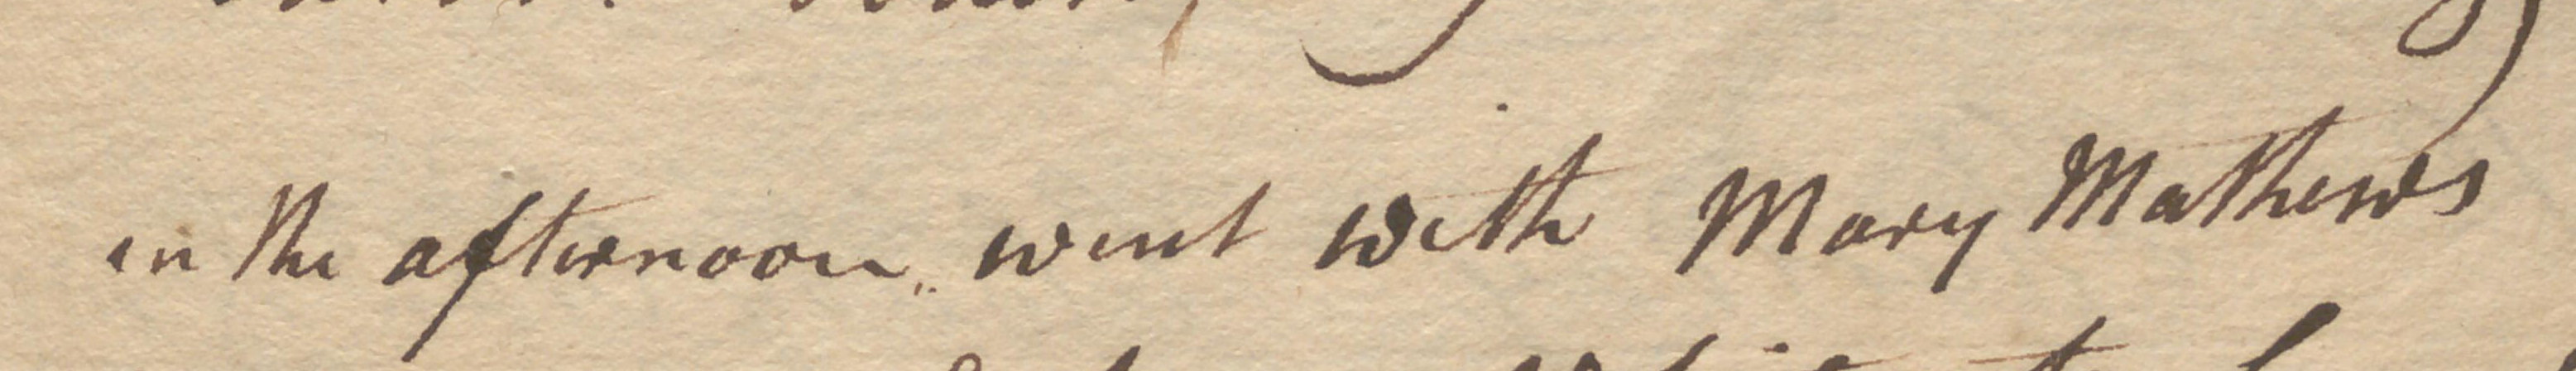in the afternoon went with Mary Mathews
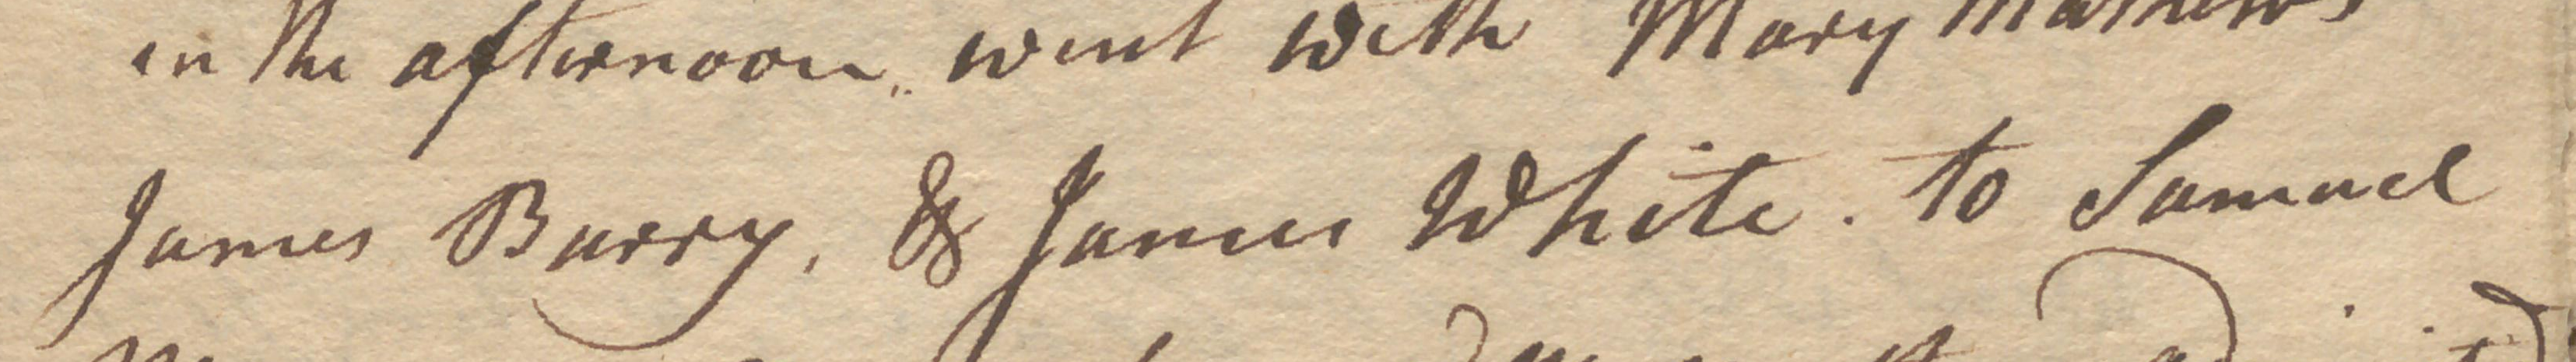James Barry, & James White. to Samuel
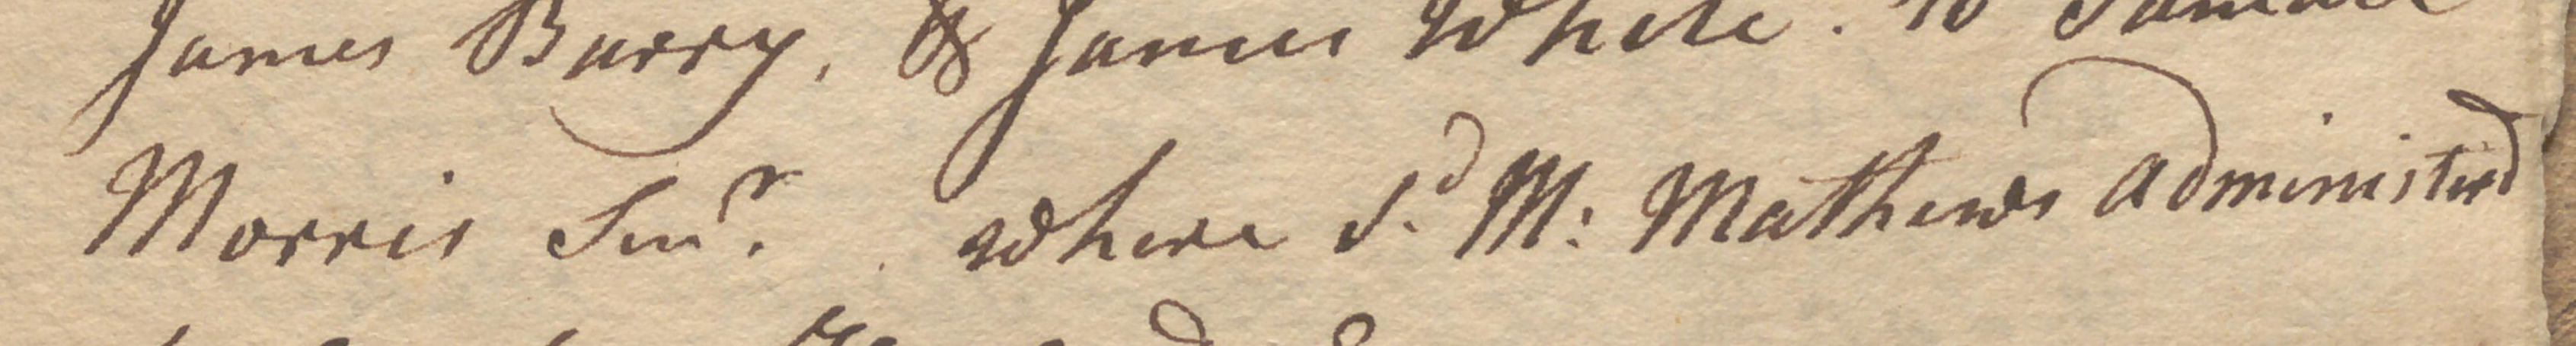Morris Sen^r. where s^d. M: Mathews Administers
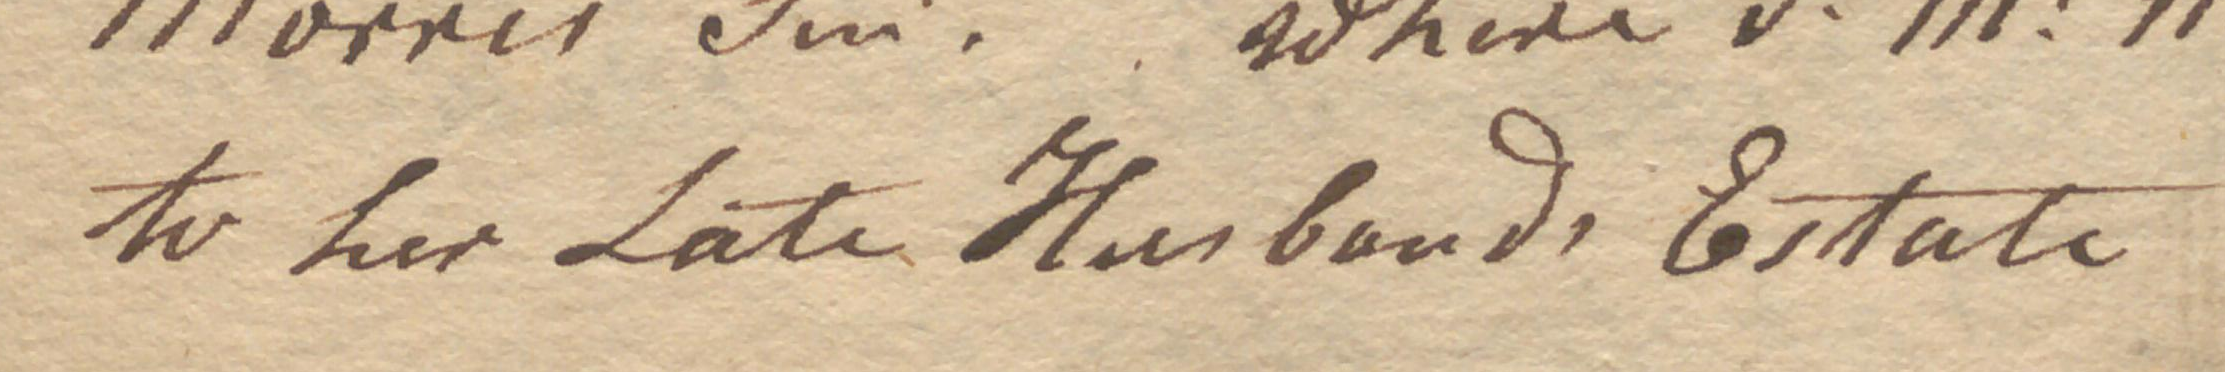to her Late Husbands Estate
